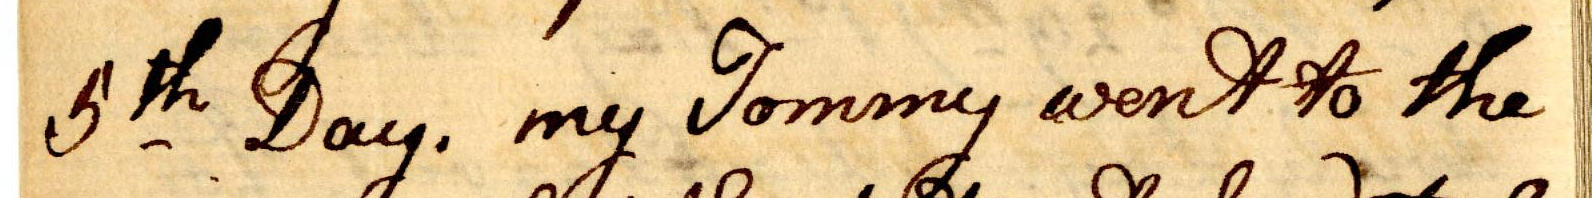5^th Day, my Tommy went to the
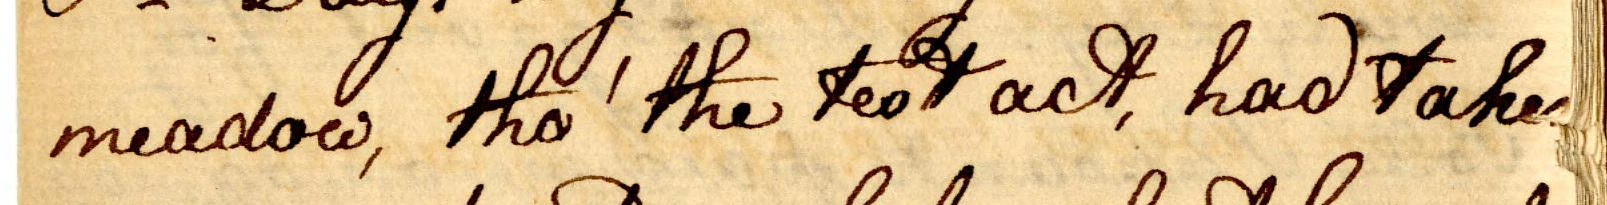meadow, tho' the test act, has taken
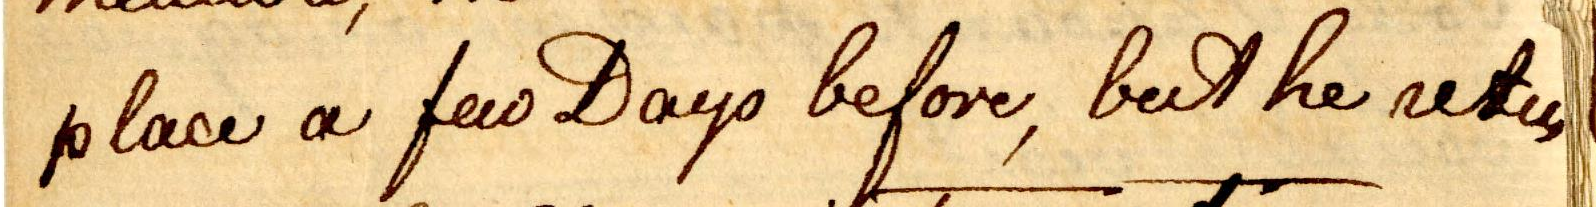place a few Days before, but he retu
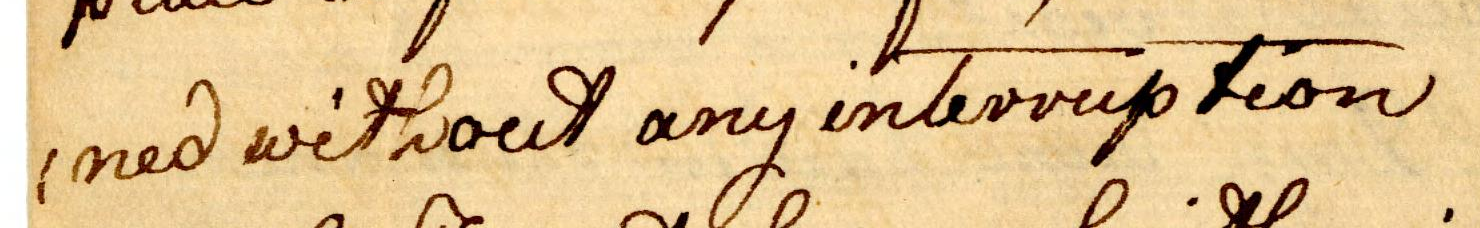-ned without any interruption
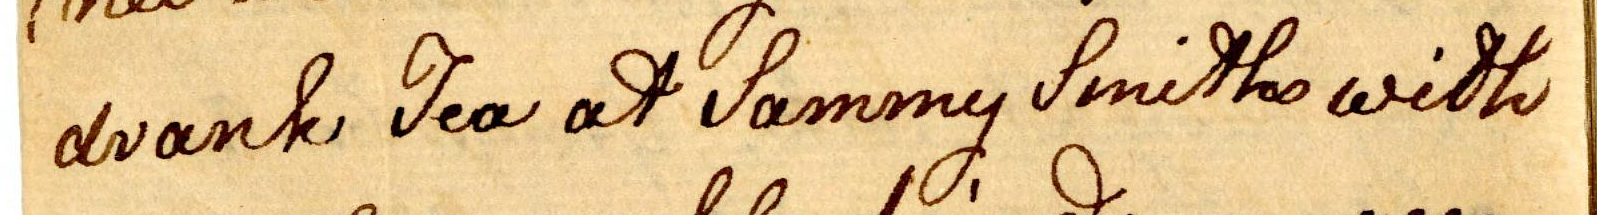drank tea at Sammy Smiths with
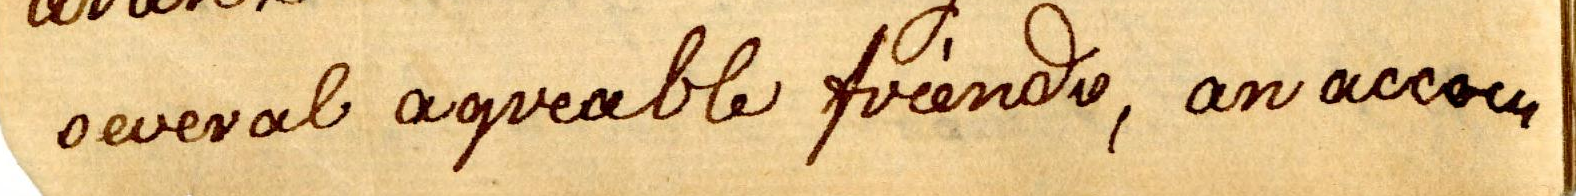several agreable friends, an accoun
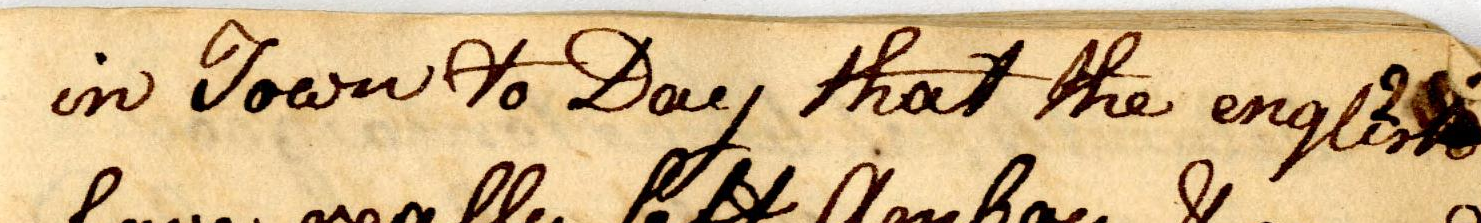in Town to Day that the english
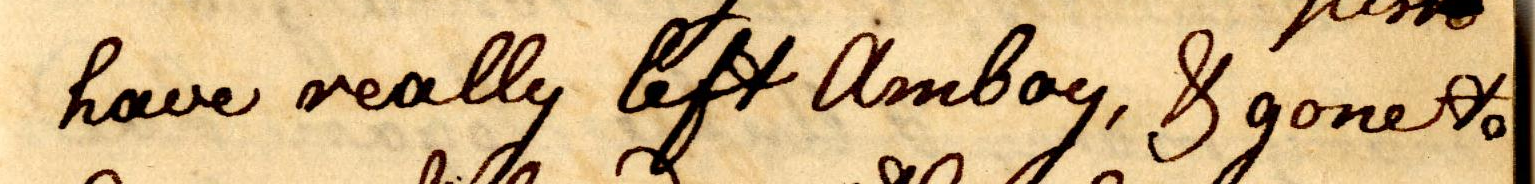have really left Amboy, & gone to
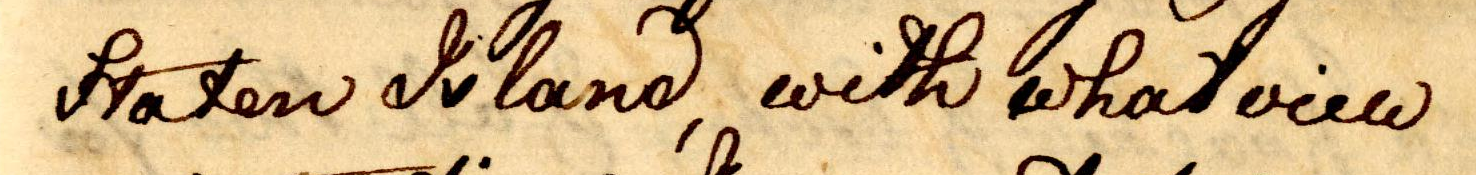Staten Island, with what view
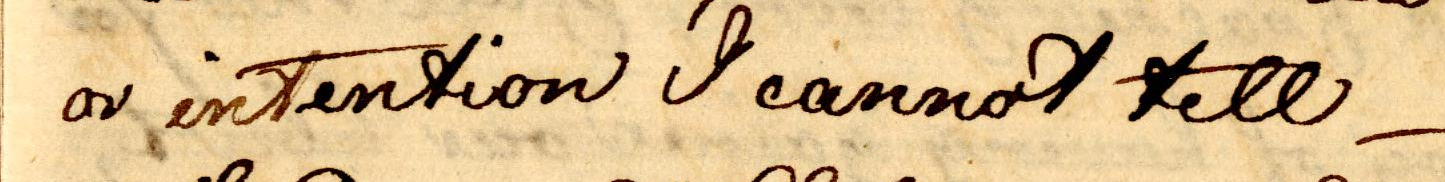or intention 'I cannot tell-
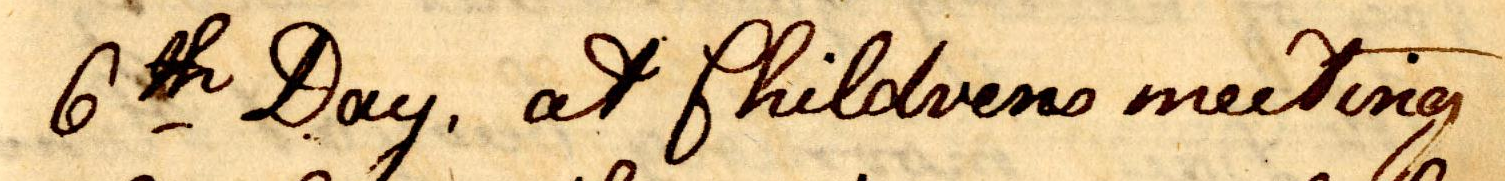6^th Day. at Childrens meeting
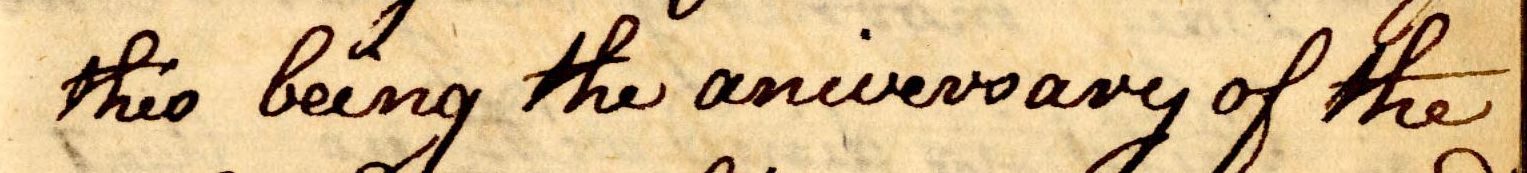this being the aniversary of the
